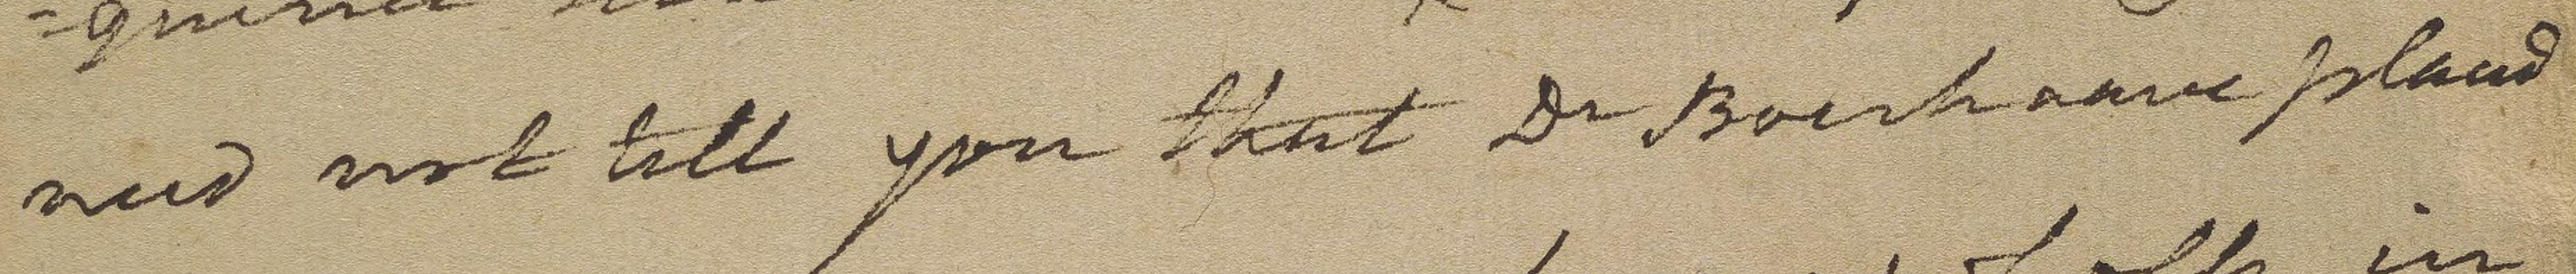need not tell you that D^r Boerhaave placed
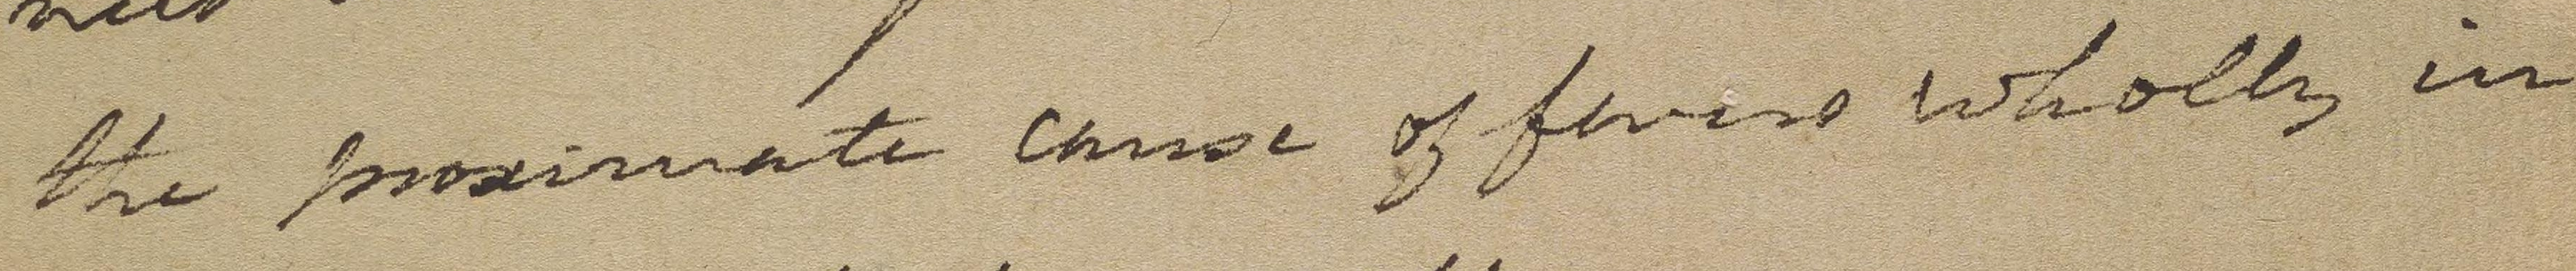the proximate cause of fevers wholly in
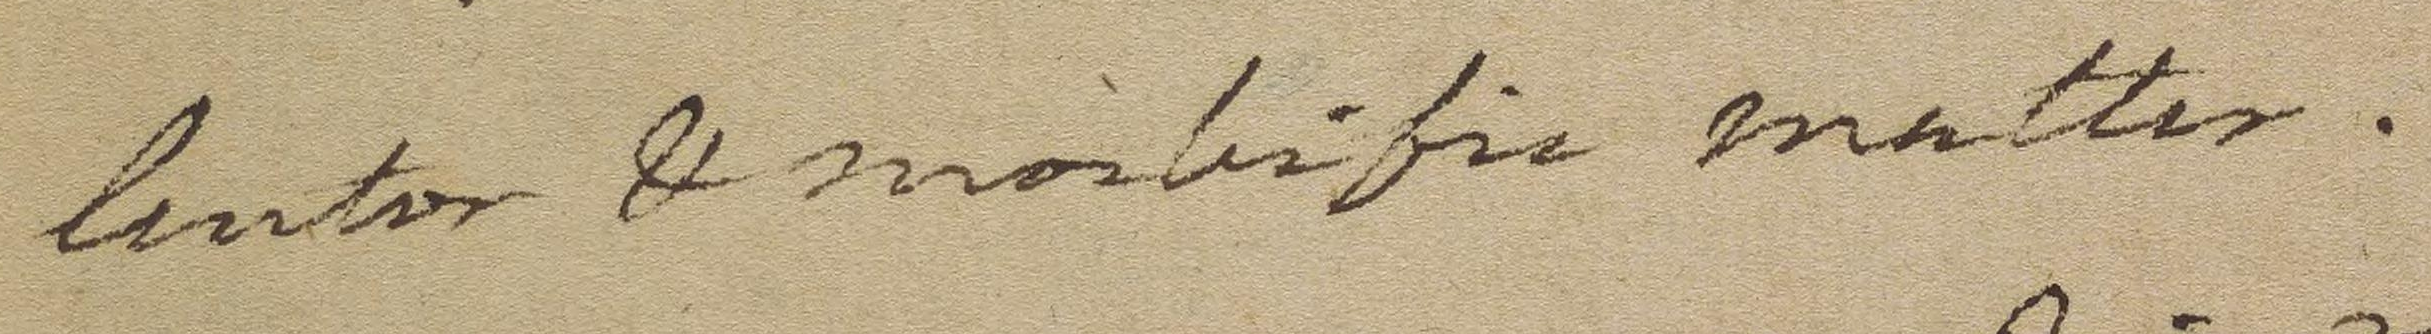lentor & morbific matter.
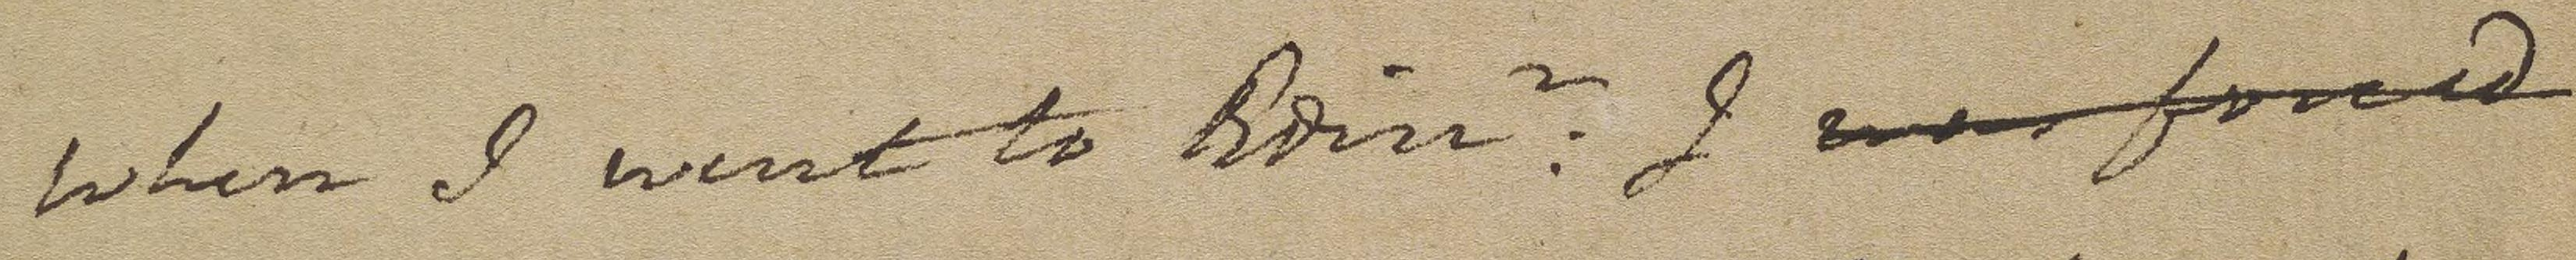When I went to Rein^r: I [was forced]
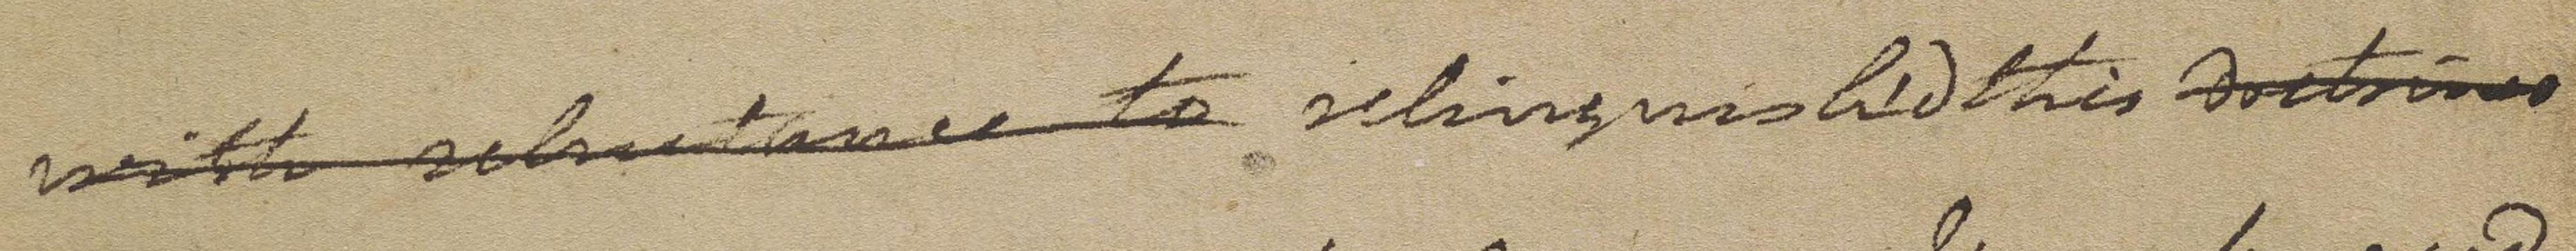[with reluctance to] relinquish'd this [doctrine]
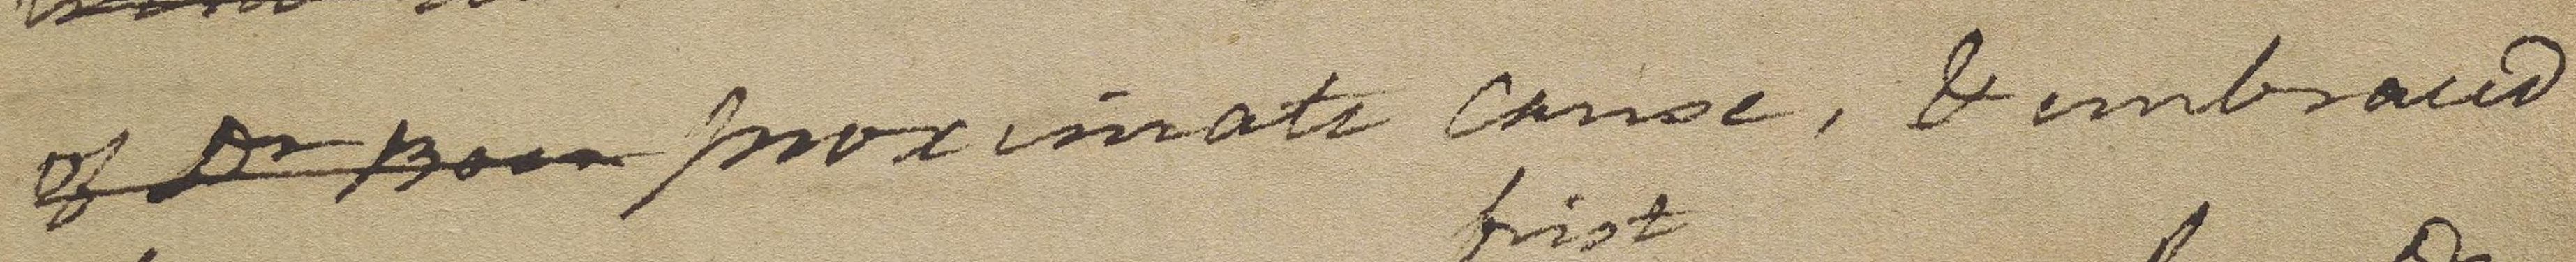[of D^r Boer] proximate cause, & embraced
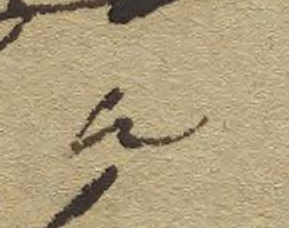a
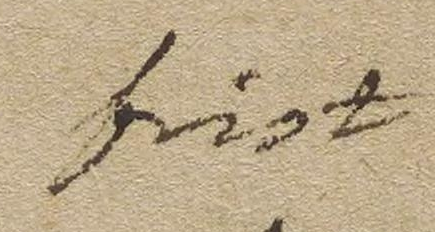first
